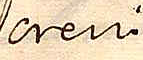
creui
